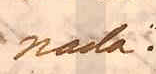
nada.
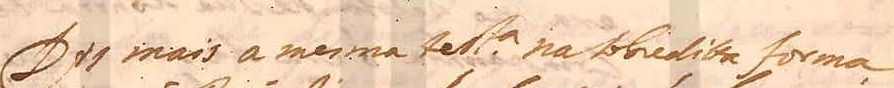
Dis mais a mesma test.a na sobreditta forma
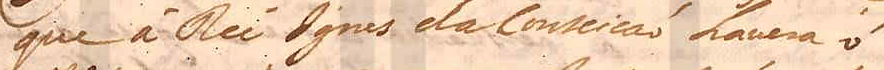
que á Reé Ignes da Conceiçaõ hauera ó
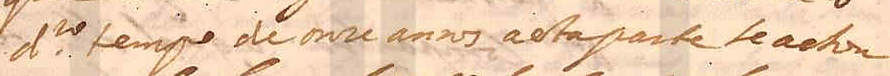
d.to tempo de onze annos a esta parte se achou
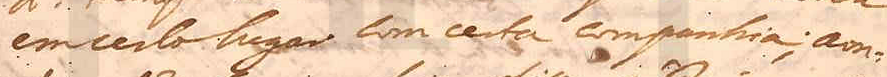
em certo lugar com certa companhia; aon
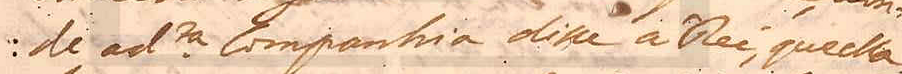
de a d.ta companhia disse a Ree, que ella
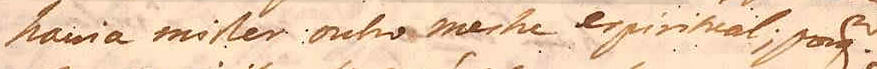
hauia mister outro mestre espiritual, porqto.
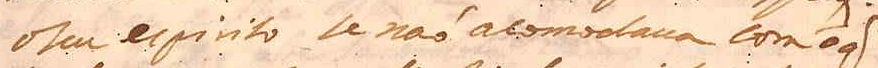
o seu espirito se naõ acomodaua com o q̄
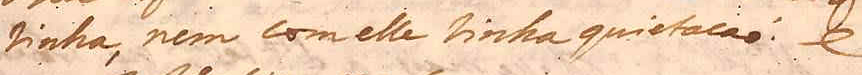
tinha, nem com elle tinha quietaçaõ. E
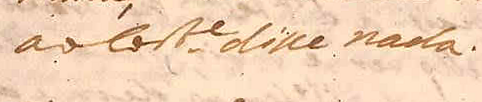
ao cost.e disse nada.
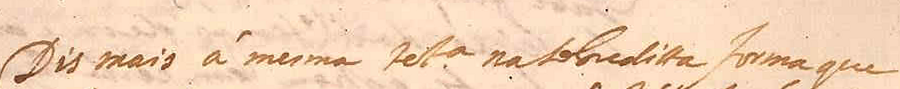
Dis mais á mesma test.a na sobreditta forma, que
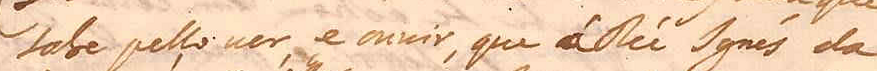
sabe pello uer, e ouuir, que á Reé Ignes da
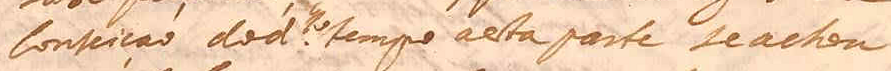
Conseiçaõ do d.to tempo a esta parte se achou
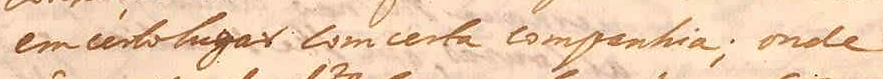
em certo lugar com certa companhia; onde
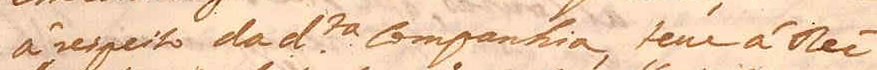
á respeito da d.ta companhia, teue á Reé
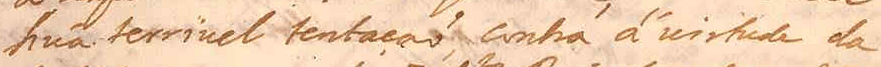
huā terrivel tentaçaõ contra á uirtude da
